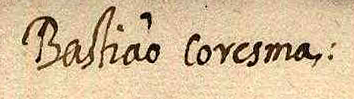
Bastião coresma:
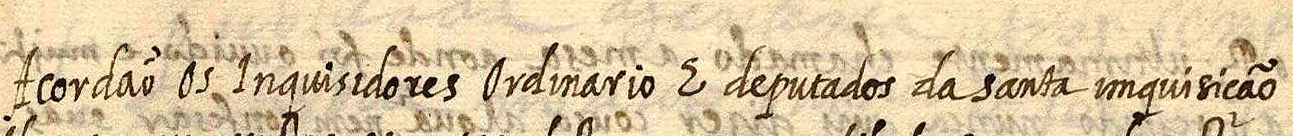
Acordaõ os Inquisidores Ordinario E deputados da santa imquisição
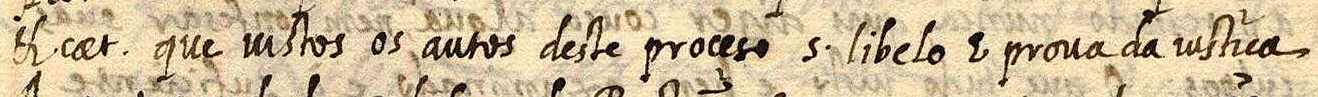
&. cæt. que uistos os autos deste proceso s. libelo E proua da iustica
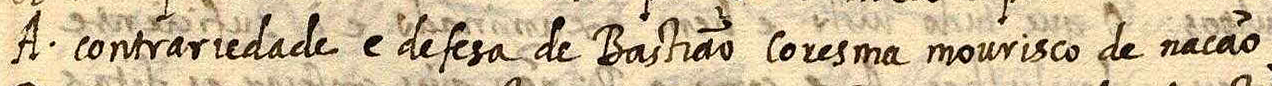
A. contrariedade e defesa de Bastião Coresma mourisco de nacão
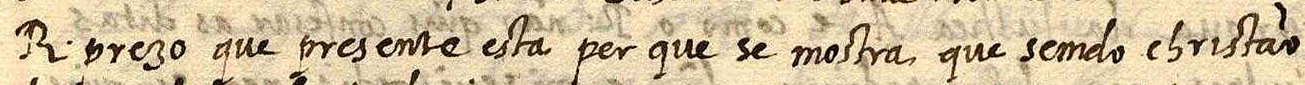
R. prezo que presente esta per que se mostra que semdo christão
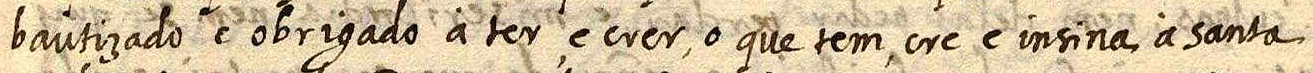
bautizado e obrigado a ter, e crer, o que tem, cre e insina a santa
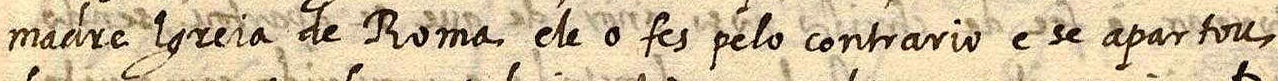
madre Igreia de Roma ele o fes pelo contrario e se apartou,
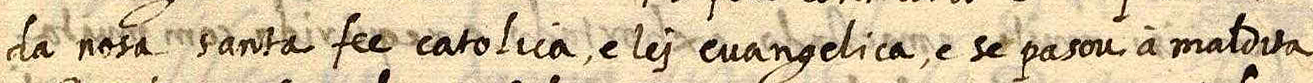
da nosa santa fee catolica, e lej euangelica, e se pasou a maldita
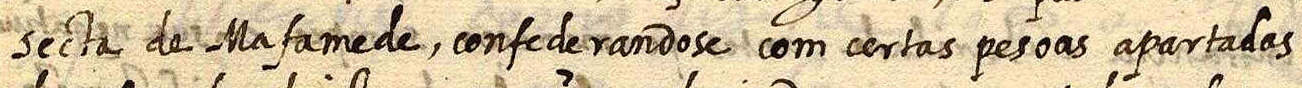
secta de Mafamede, confederandose com certas pesoas apartadas
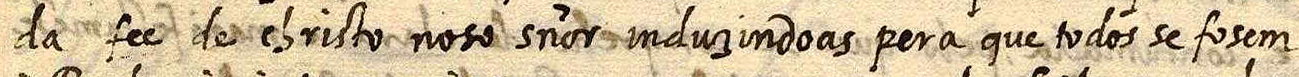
da fee de christo noso snōr induzindoas pera que todos se fosem
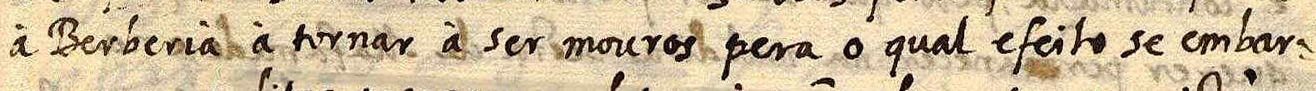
à Berberia a tornar a ser mouros pera o qual efeito se embar
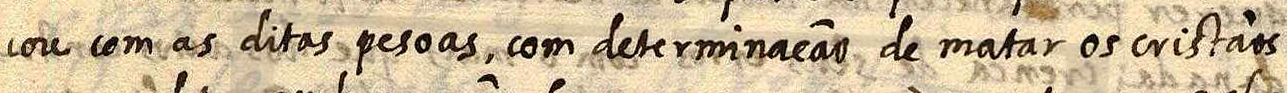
cou com as ditas pesoas, com determinação de matar os cristãos
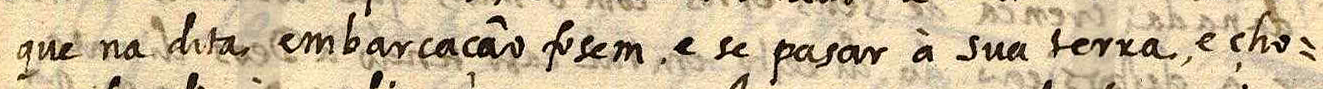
que na dita embarcaçaõ fosem e se pasar à sua terra, e cho
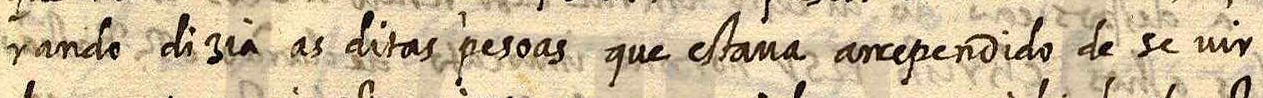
rando dizia as ditas pesoas que estaua arrependido de se uir
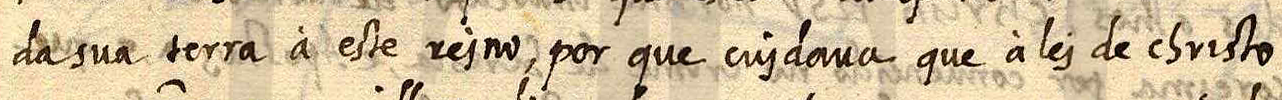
da sua terra a este rejno, porque cujdaua que a lej de christo
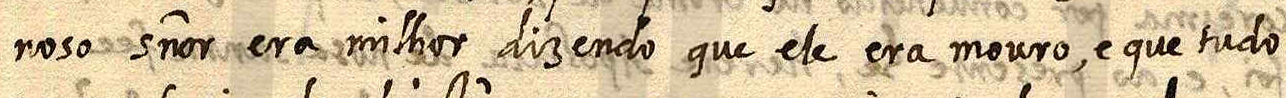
noso sn̄or era milhor dizendo que ele era mouro, e que tudo
